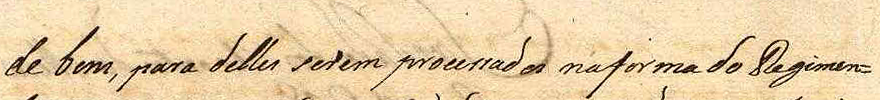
de bem, para delles serem processados na forma do Regimen
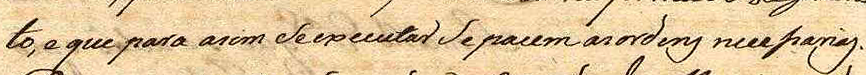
to, e que para asim se executar se pacem as ordens necessarias.
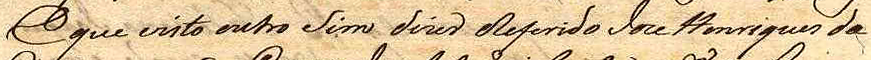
E que visto outrosim dizer o Referido Ioze Henriques da
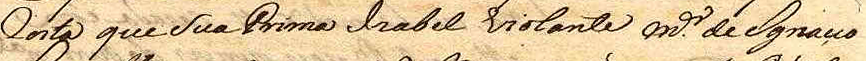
Costa que sua Prima Izabel Violante m.er de Ignacio
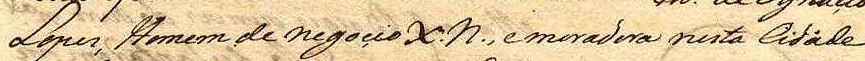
Lopes, Homem de negocio x. n., e moradora nesta Cidade
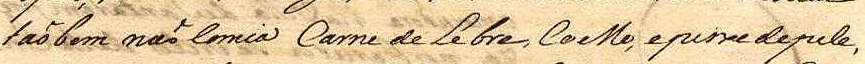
taõbem naõ comia Carne de Lebre, Coelho, e peixe de pele,
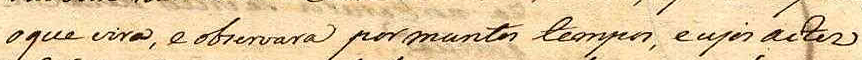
o que vira, e observara por muntos tempos, cujos actos
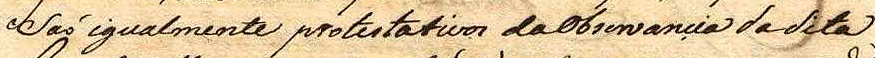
Saõ igualmente protestativos da observancia da dita
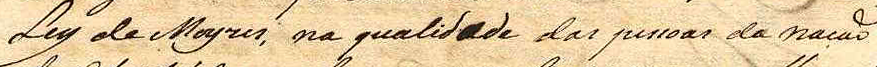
Ley de Moyzes, na qualidade das pessoas da naçaõ
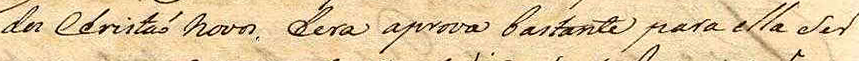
dos Christaõ novos. Hera a prova bastante para ella ser
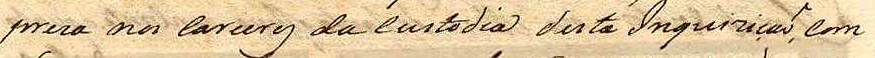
preza nos carceres da Custodia desta Inquiziçaõ, com
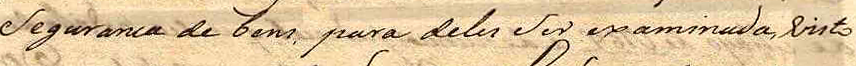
segurança de bens para deles ser examinada, visto
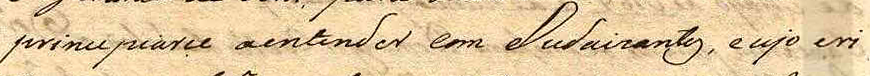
principiarce a entender com Iudaizantes, cujo cri
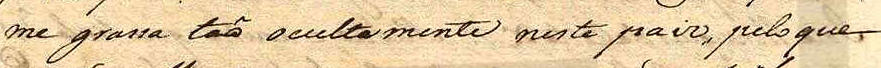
me grassa taõ ocultamente neste paiz, pelo que
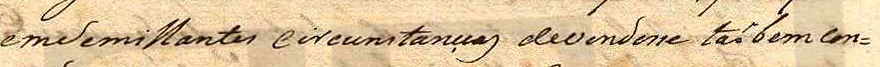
em semilhantes circunstancias devendosse taõbem con
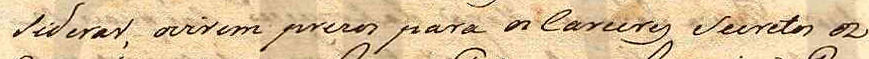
siderar, o virem prezos para os Carceres secretos oz
